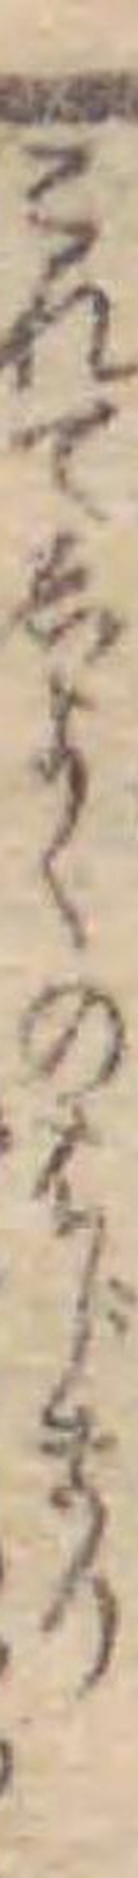これてしよくのはじまり
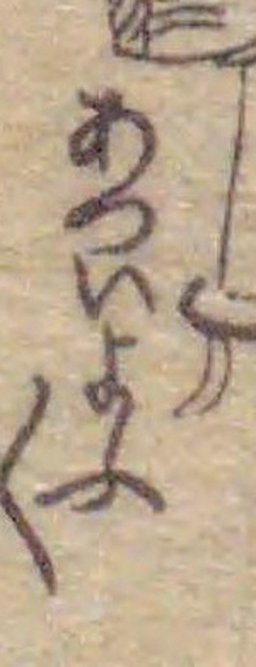あついよふ
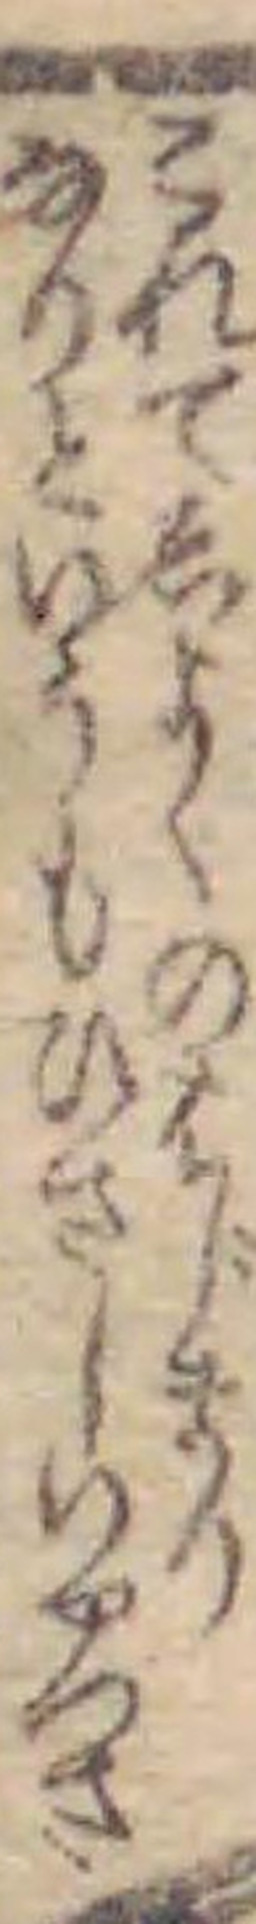なりというもひさしいやつさ

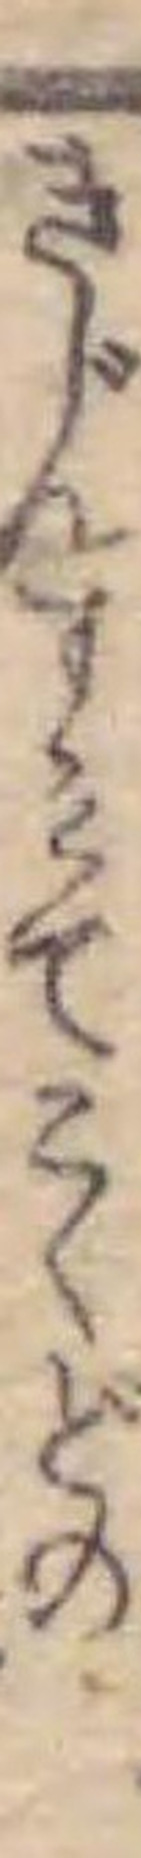きじんすみてこくどの
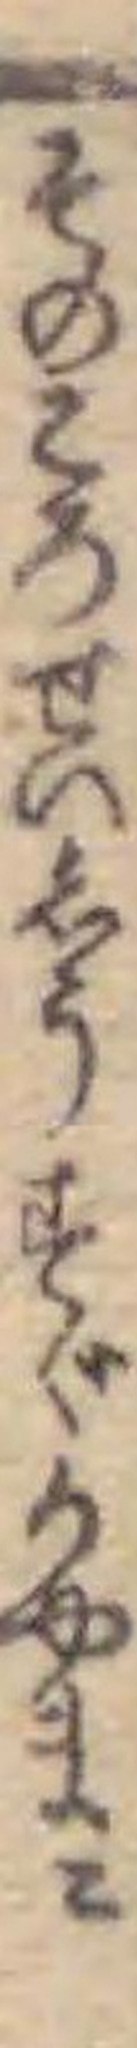そのころせいしうすゞかやまに
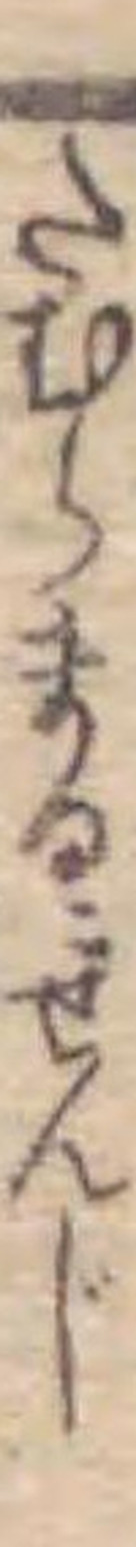たむらまるにせんじ
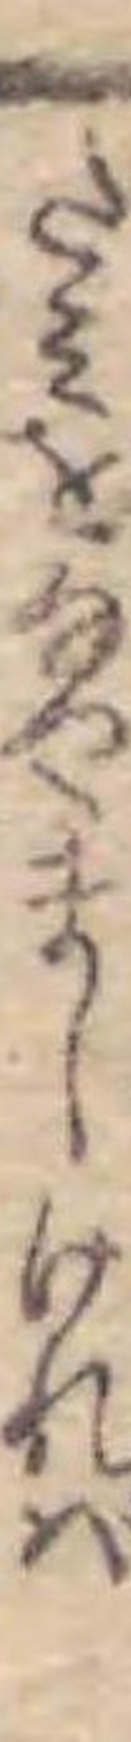たみをなやましければ
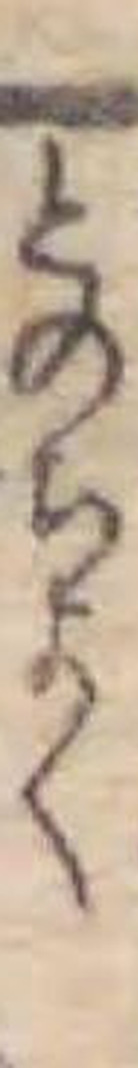とのちよく
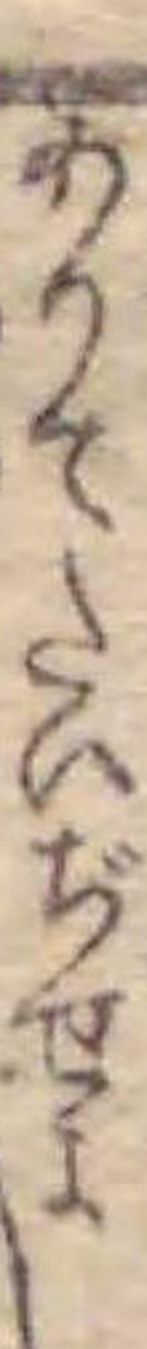ありてたいぢせよ
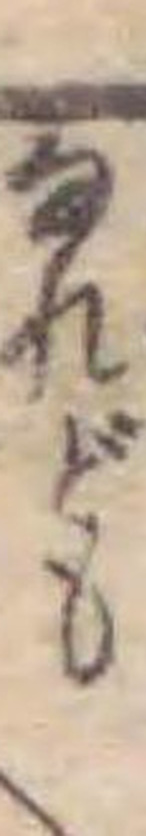なれども
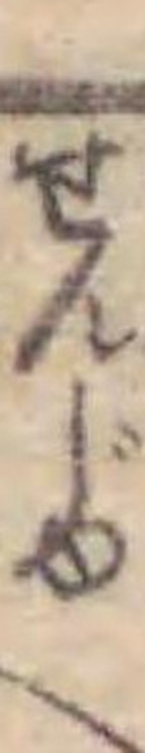せんじゆ
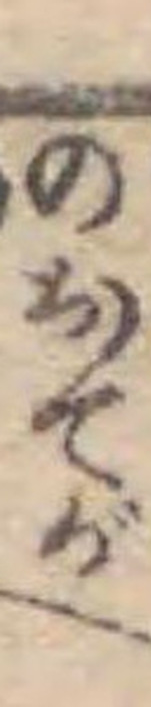のおてが
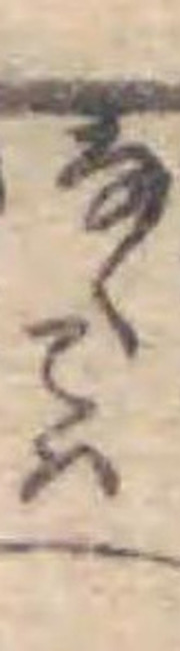なくては
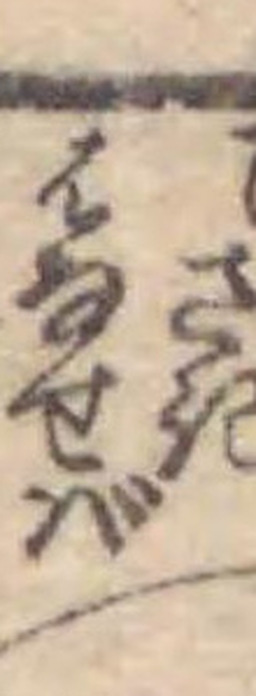はなせば
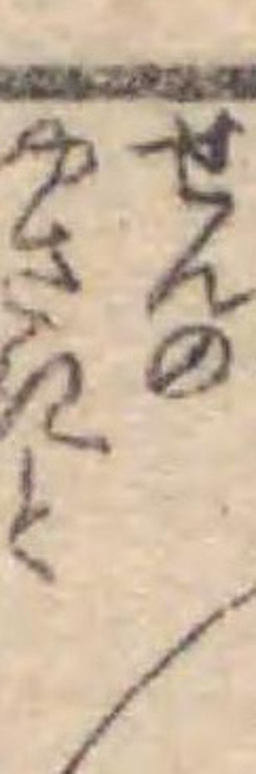やさきと
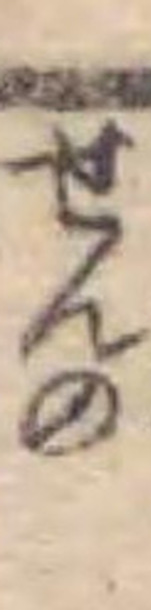せんの
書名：大悲の千六本 : 1巻
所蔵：国立国会図書館 National Diet Library, JAPAN
